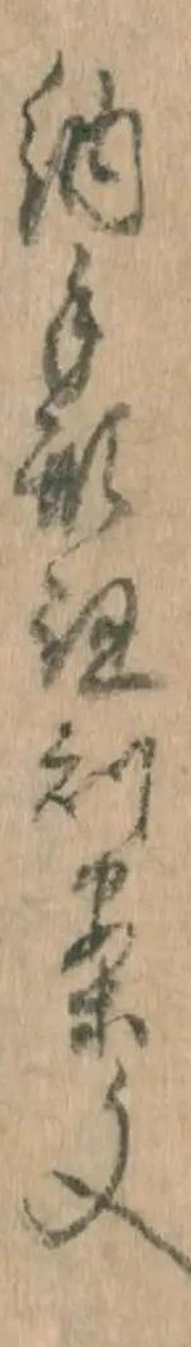納手形認則案文
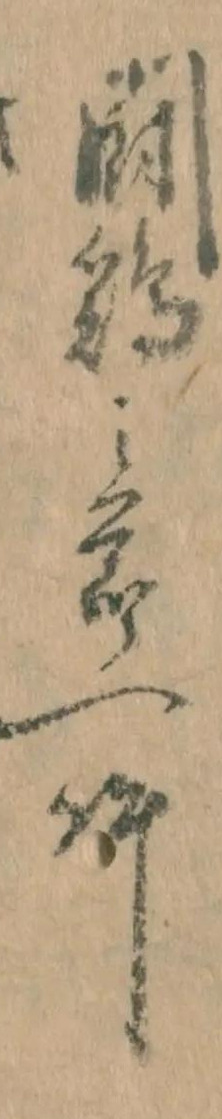闘鶏之節一件
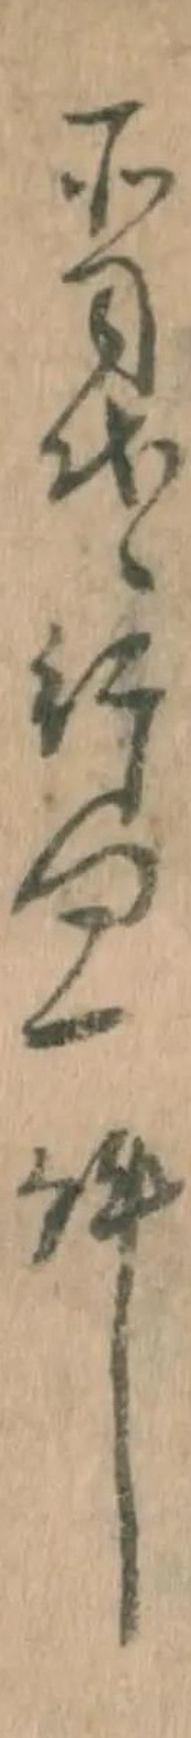所司代へ行向一件
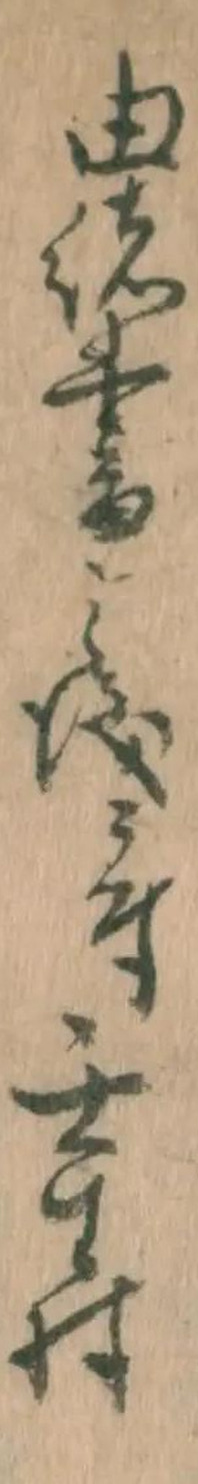由緒書之儀ニ付壬生村
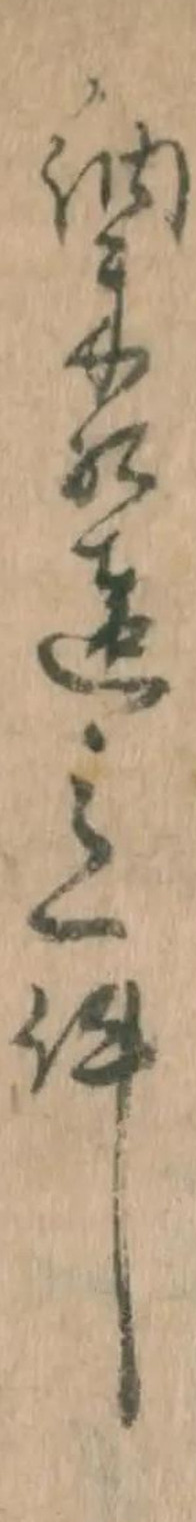納米相違之一件
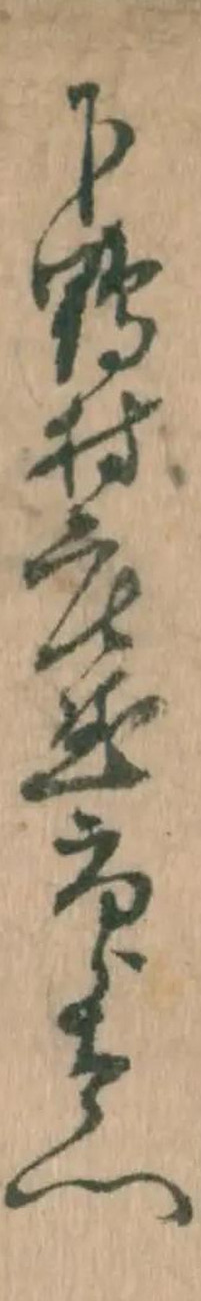下鴨村庄屋市郎右衛門
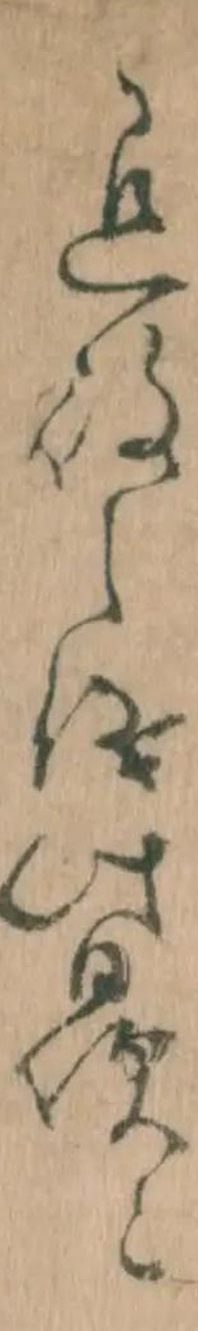退役之儀此日便ニ
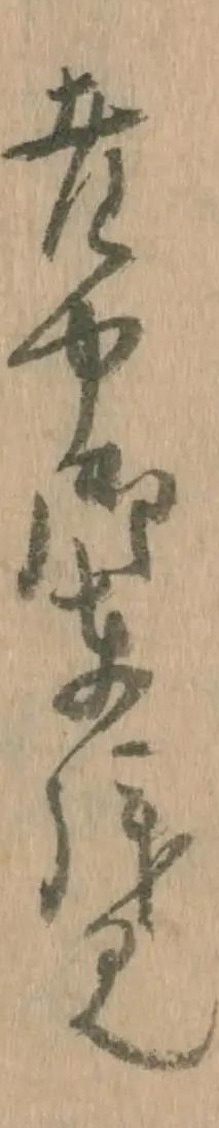老中御車拝見
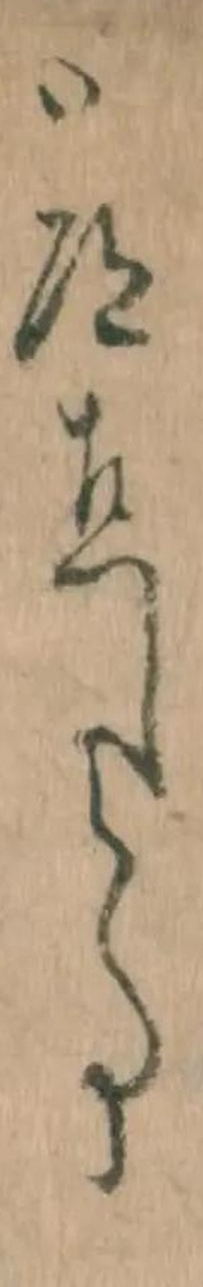御道直し之事
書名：賀茂社記録. 第61冊
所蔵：国立国会図書館 National Diet Library, JAPAN
